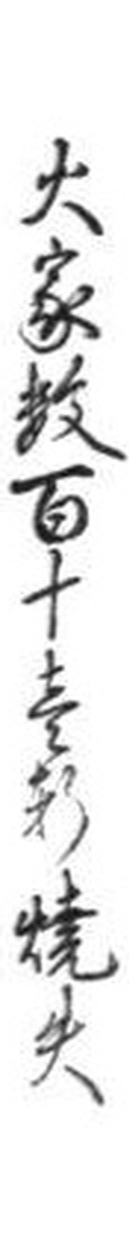火家数百十壱軒焼失
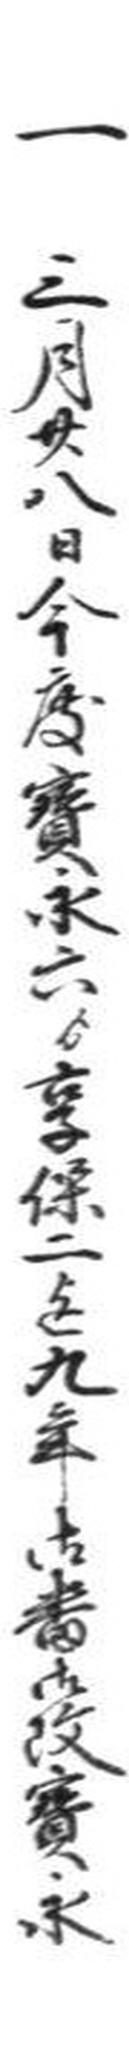一三月廿八日今度宝永六ゟ享保二迄九年御番御改宝永
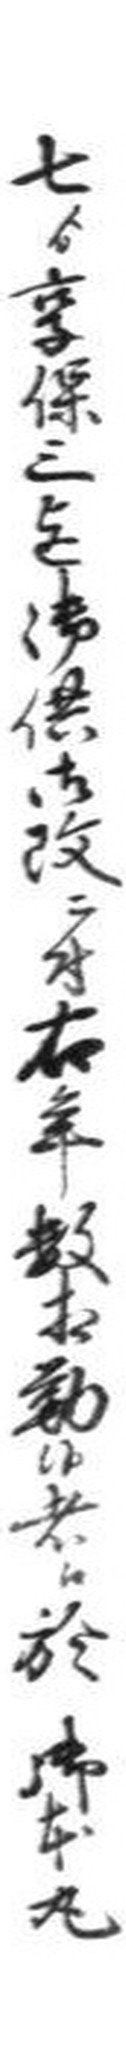七ゟ享保三迄御供御改ニ付右年数相勤候者江於御本丸
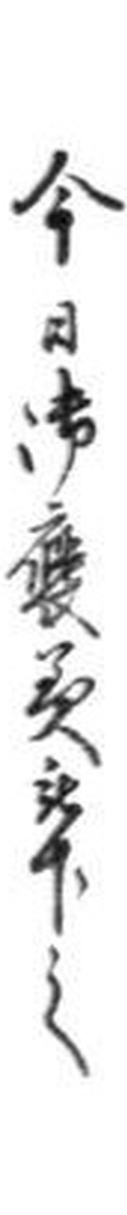今日御褒美被下之
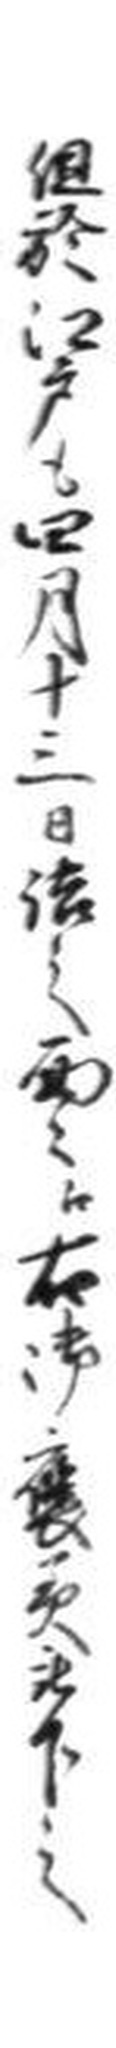但於江戸も四月十三日詰之面々江御褒美被下之
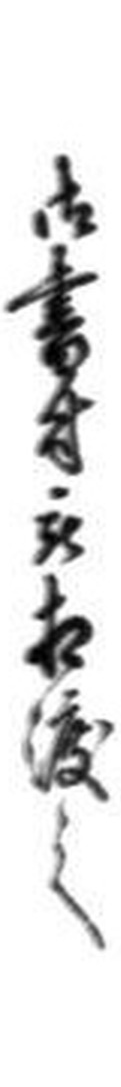御書付被相渡之
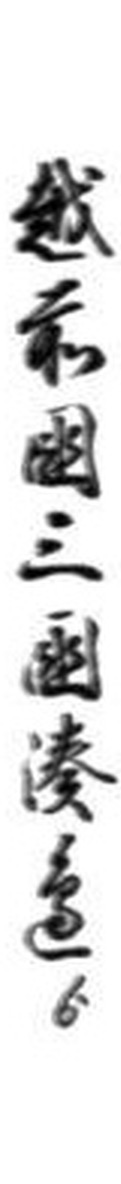越前国三国湊辺ゟ
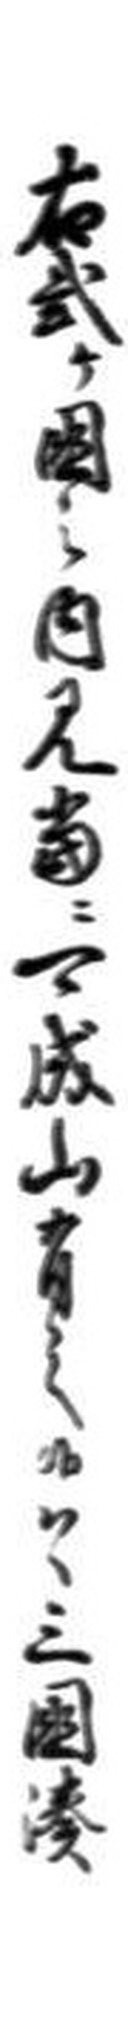右弐ケ国之内見当ニ可成山有之候ハヽ三国湊
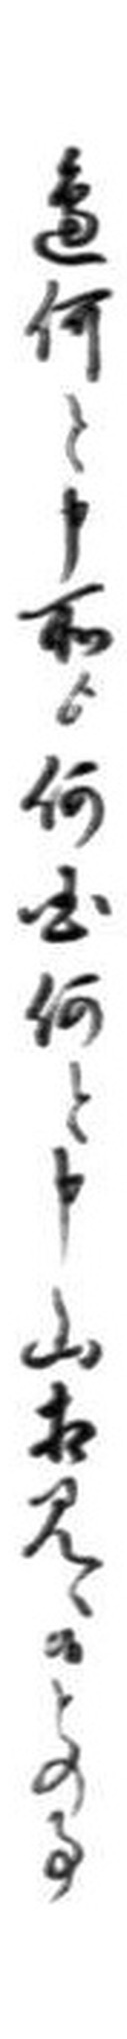辺何と申所ゟ何国何と申山相見へ候との事
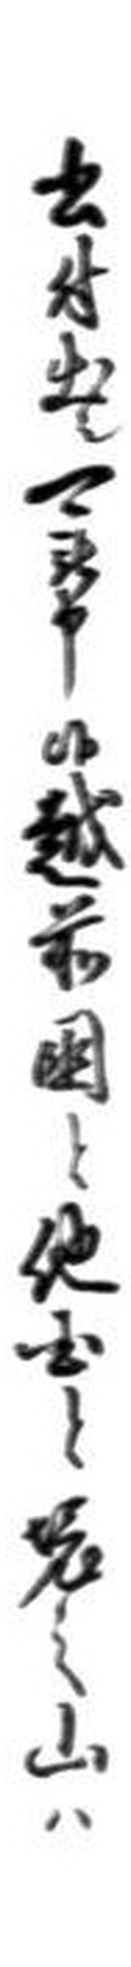書付出シ可被申候越前国と他国と境之山ハ
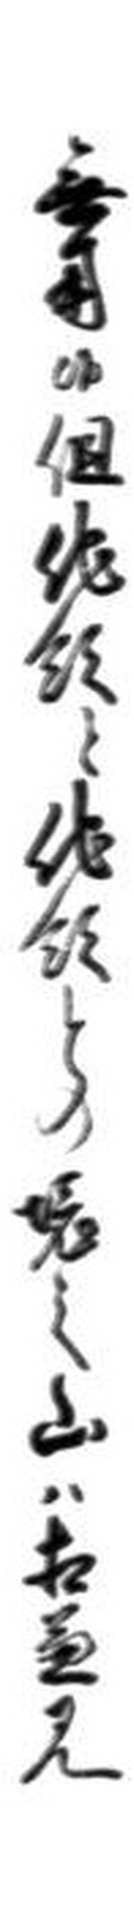無用候但他領と他領との境之山ハ相兼見
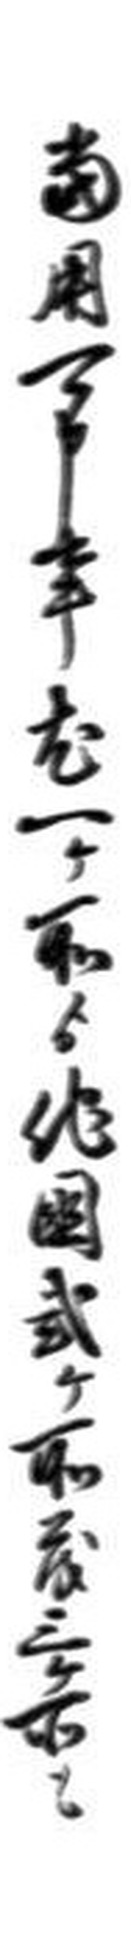当用可申事尤一ケ所ゟ他国弐ケ所茂三ケ所も

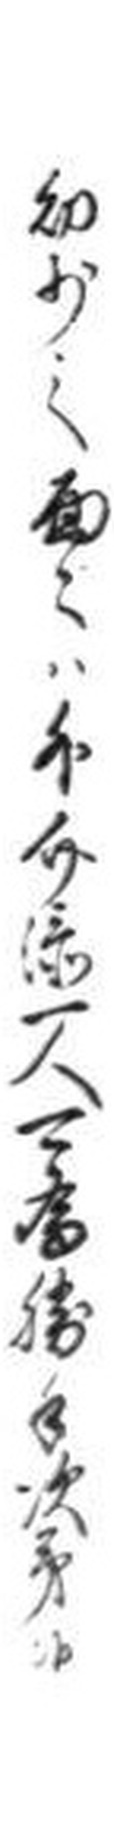幼少之面々ハ外介添一人可為勝手次第候
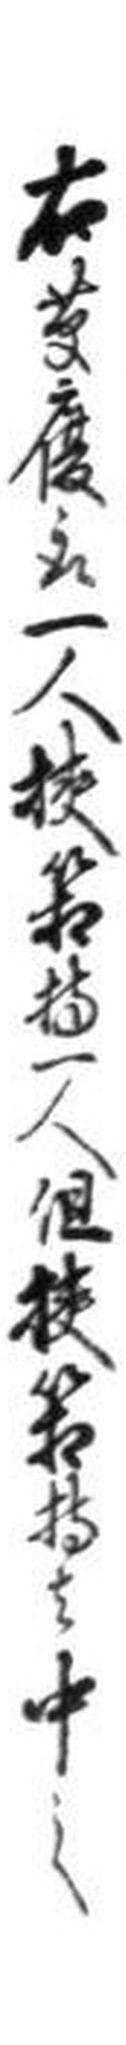右草履取一人挟箱持一人但挟箱持者中之
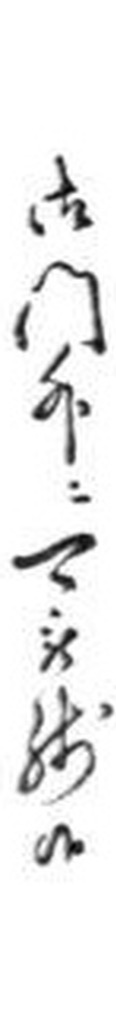御門外ニ可被残候
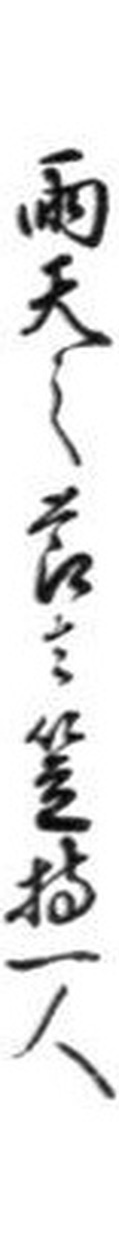雨天之節者笠持一人
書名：家譜 三十二 吉邦公 従享保二年到享保三年
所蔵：福井県文書館 Fukui Prefectural Archives
